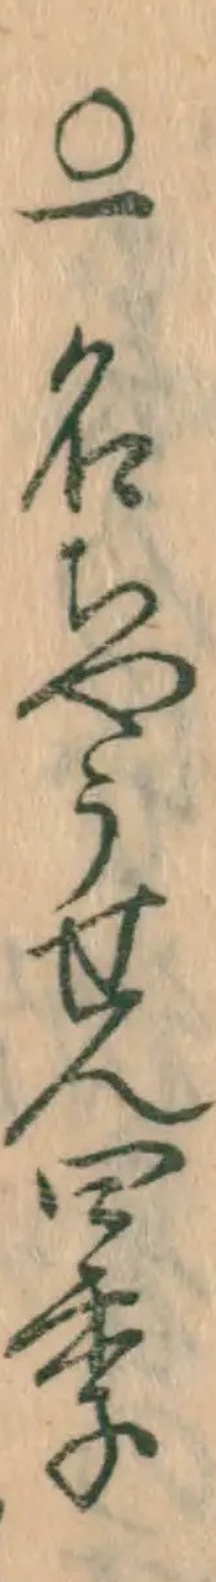○一名ちやうせん四季
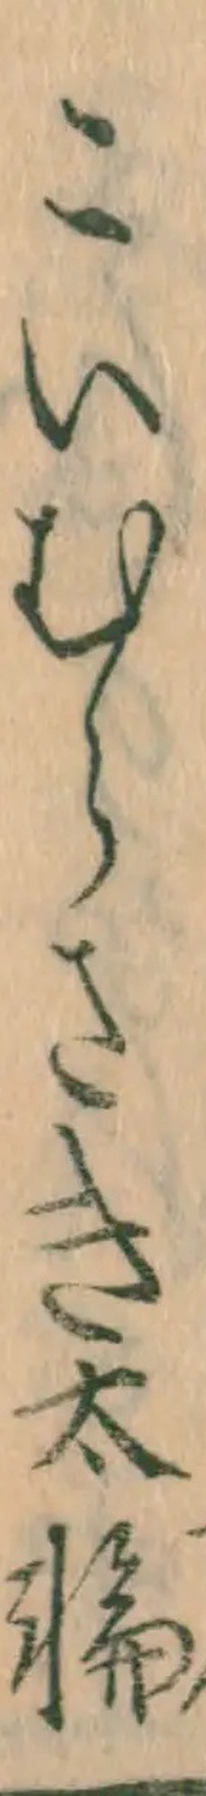こいむらさき太輪
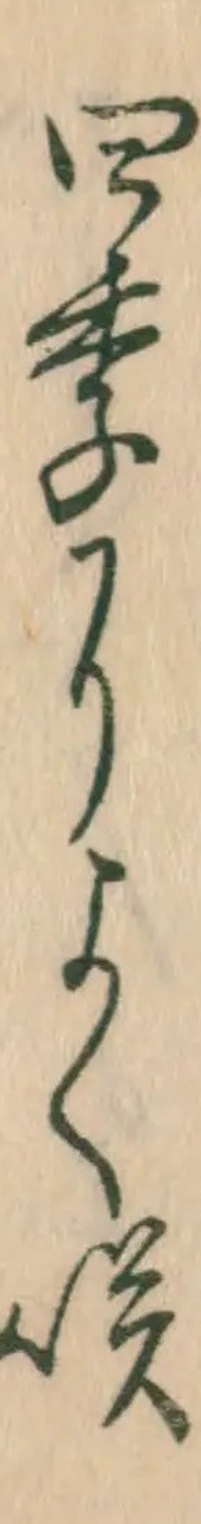四季によく咲
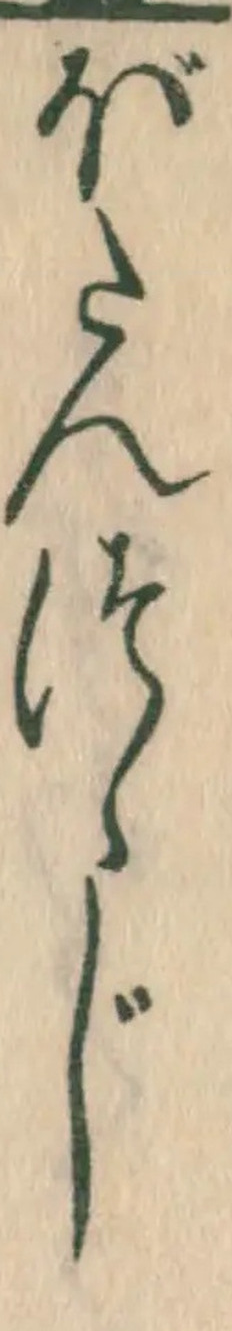ぼたんつゝじ
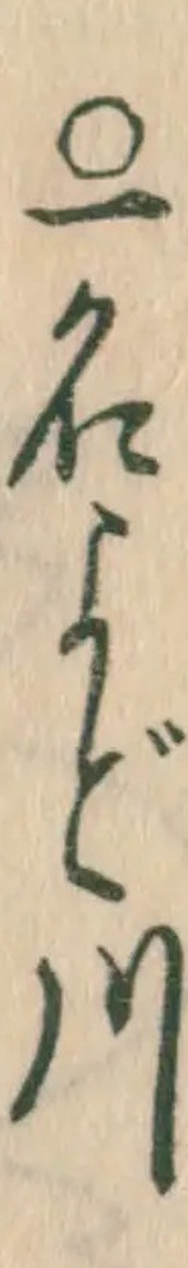○一名よど川
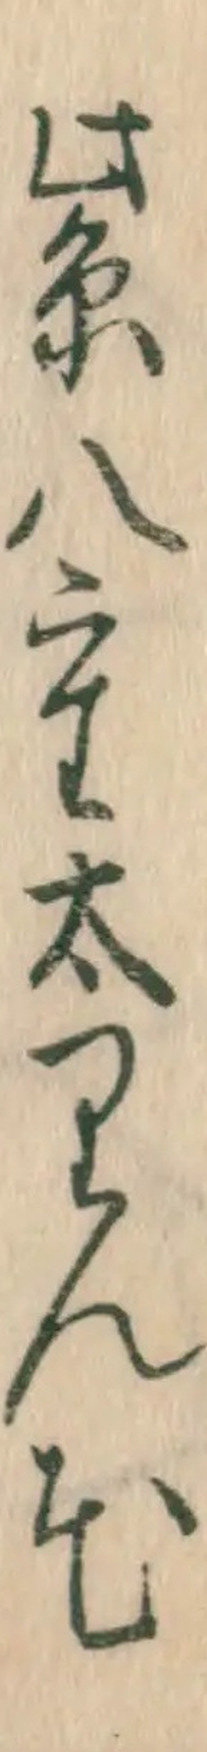紫八重太りん花
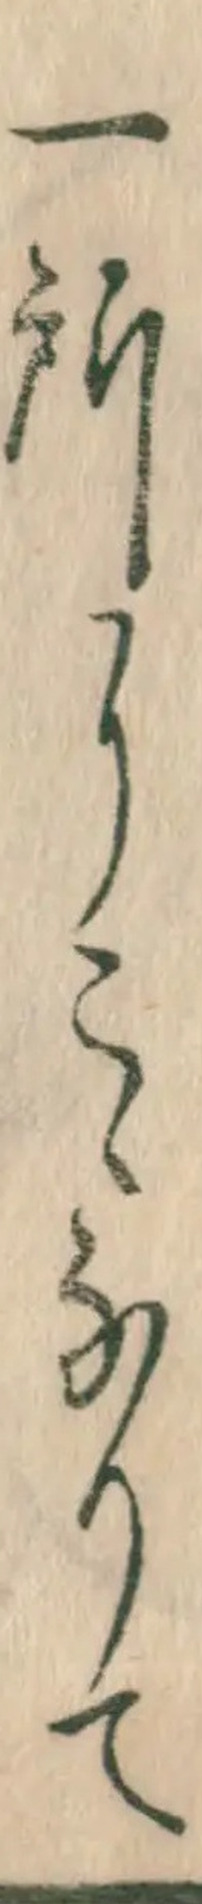一所にこくなりて
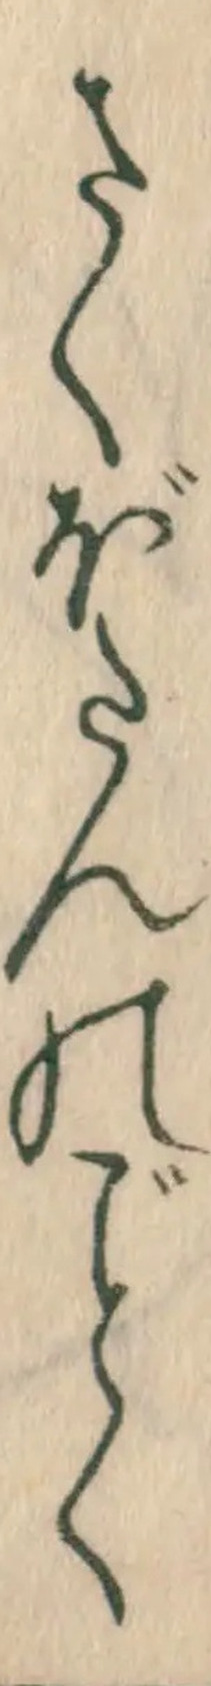さくぼたんのごとく
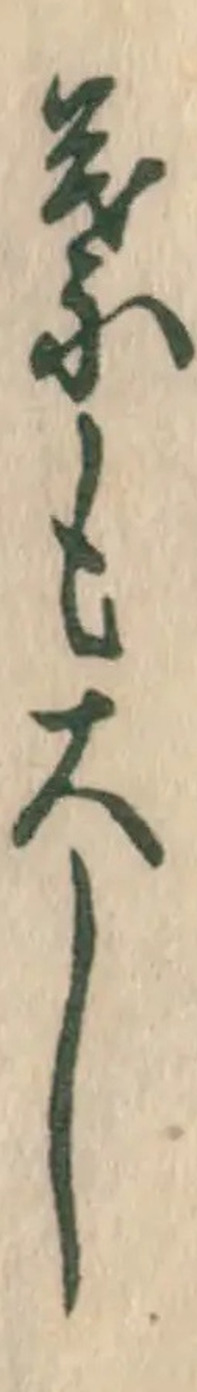葉も大し

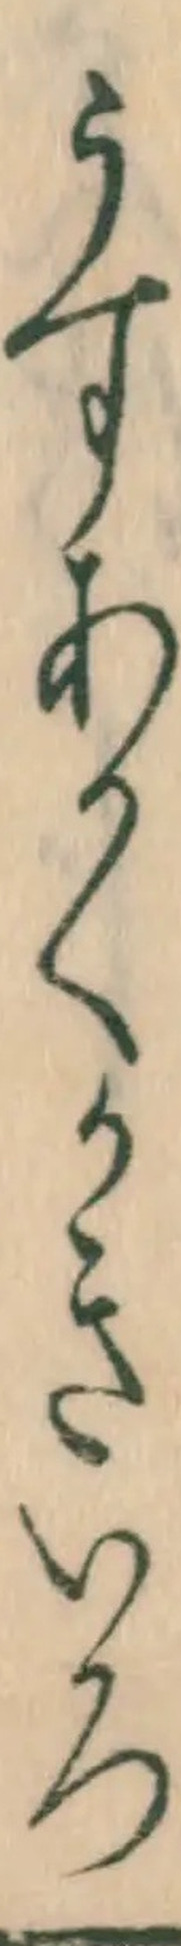うすあかくかきいろ
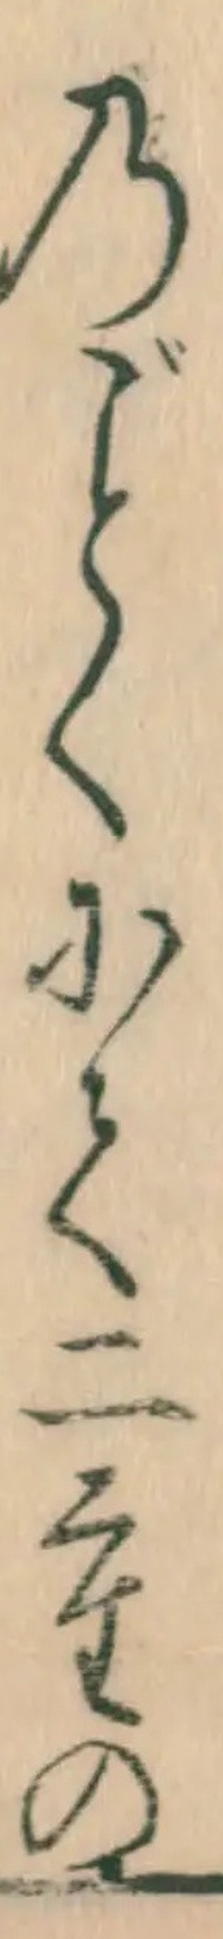のごとくにて二重の
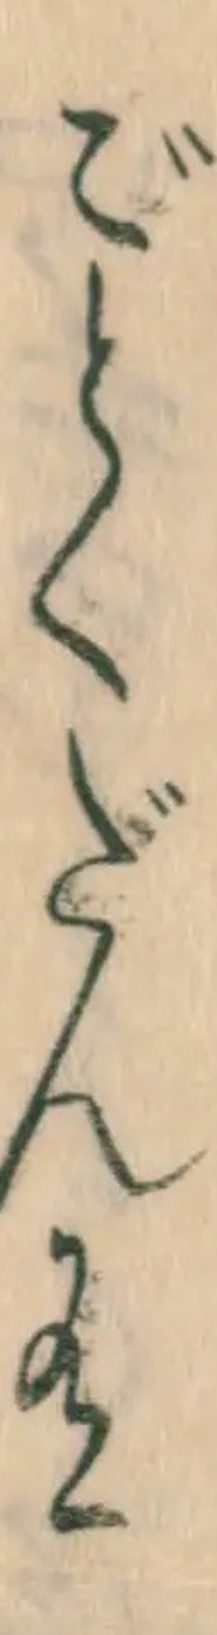ごとくだん有
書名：錦繍枕 5巻. [2]
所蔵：国立国会図書館 National Diet Library, JAPAN
